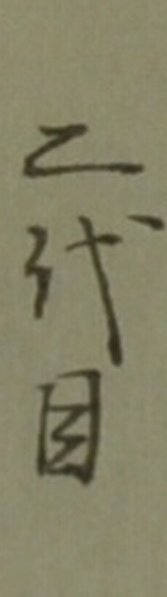二代目
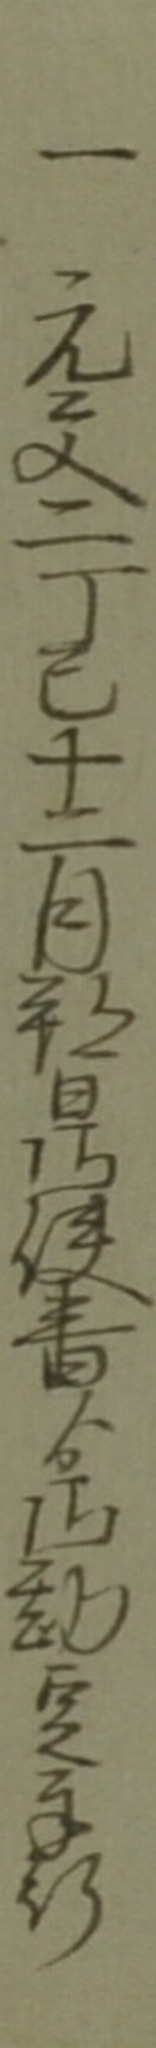一元文二丁巳十二月朔日御使番ゟ御勘定奉行
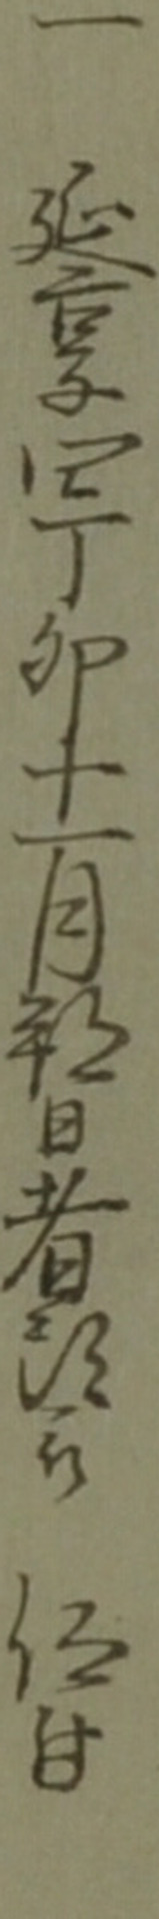一延享四丁卯十一月朔日者頭被仰付
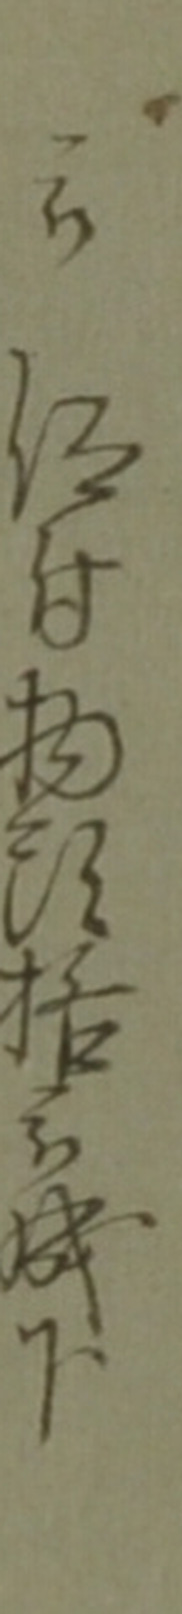被仰付物頭格被成下
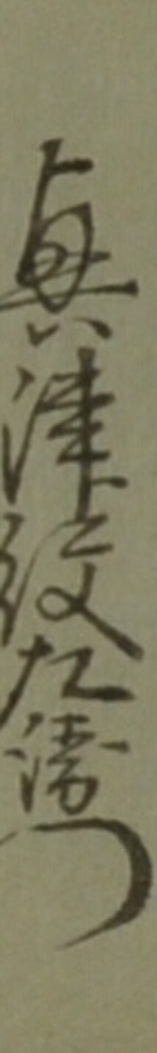興津紋左衛門
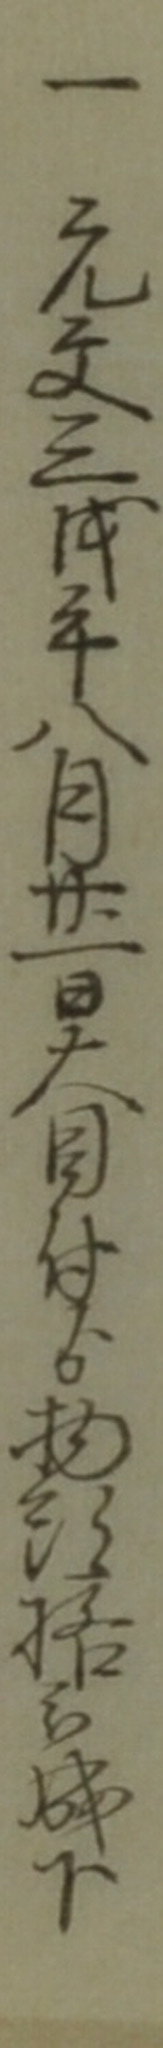一元文三戊午八月廿一日大目付ゟ物頭格被成下
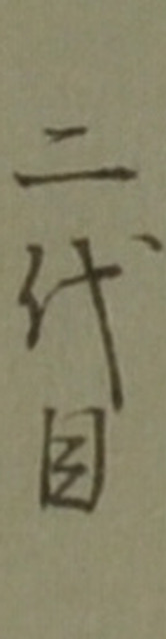二代目
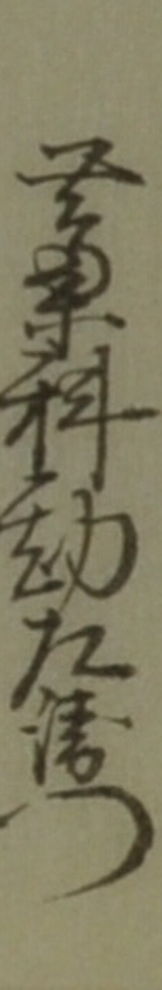藁科勘左衛門
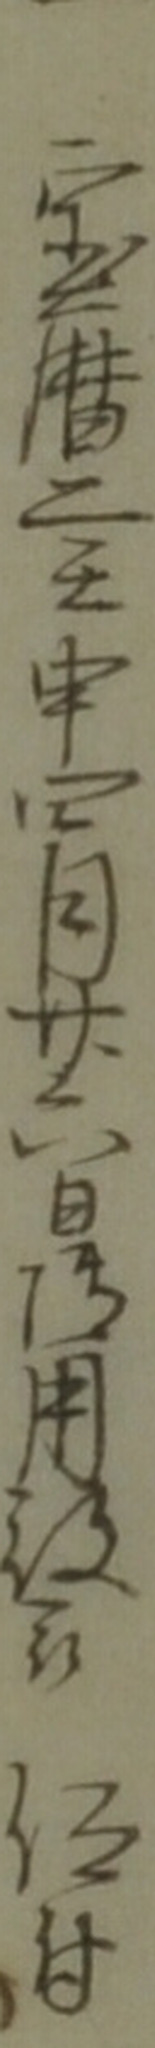一宝暦二壬申四月廿六日御用役被仰付
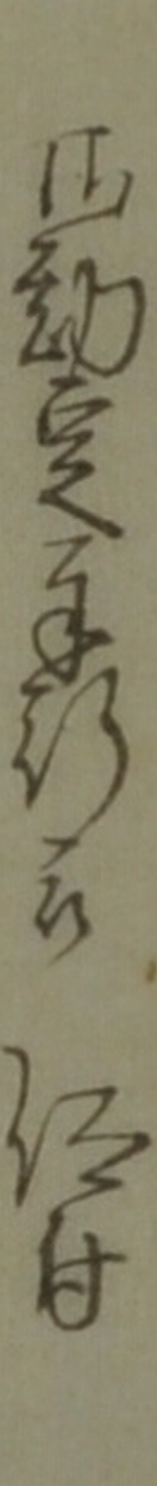御勘定奉行被仰付
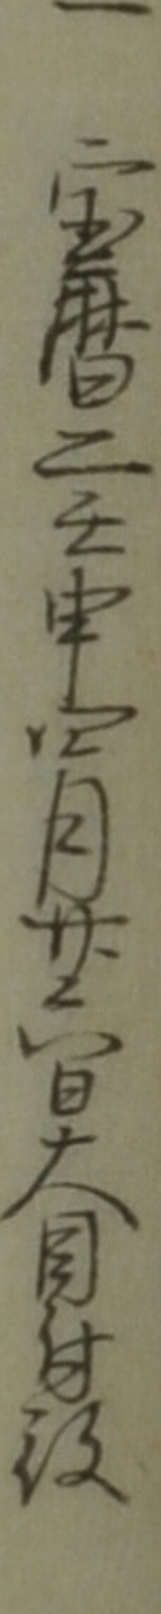一宝暦二壬申四月廿六日大目付役
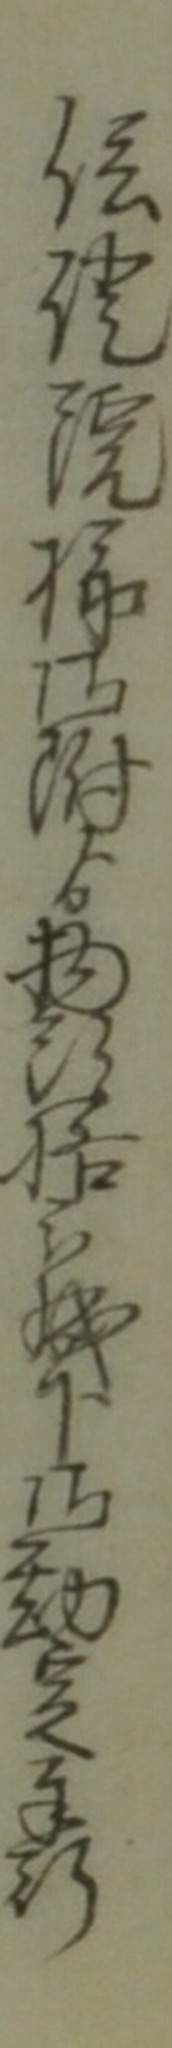信證院様御附ゟ物頭格被成下御勘定奉行
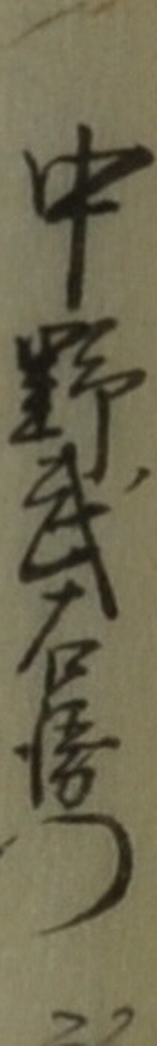中野武右衛門
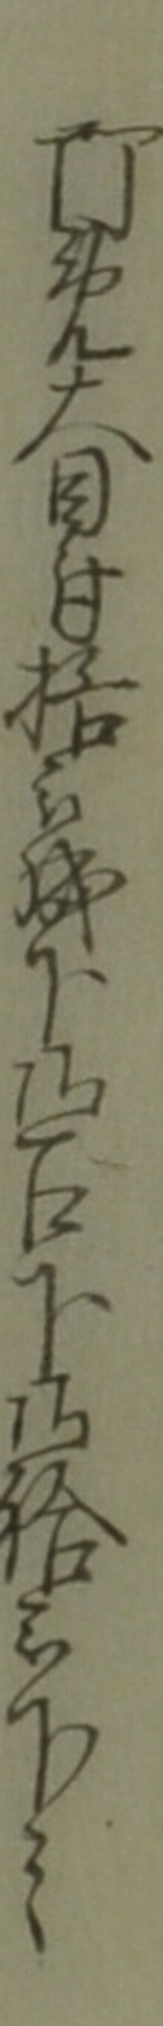御免大目付格被成下御召下御袷被下之
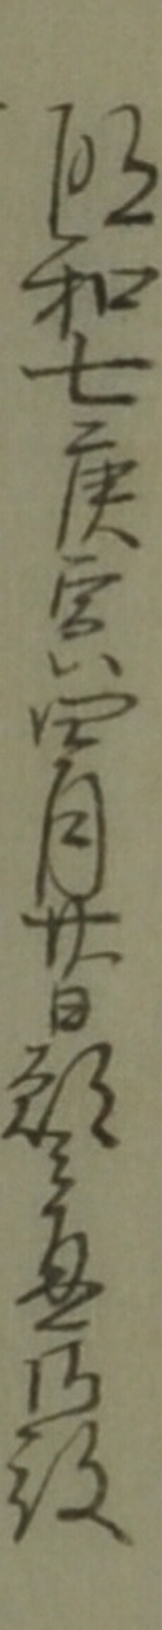一明和七庚寅四月廿日願之通御役
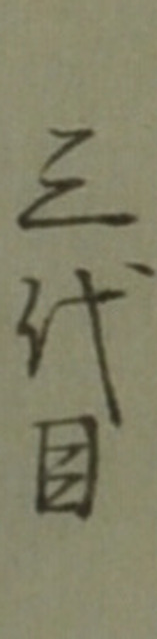三代目
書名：諸御役代々録（三）
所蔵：伊那市立高遠町図書館・合同会社AMANE
